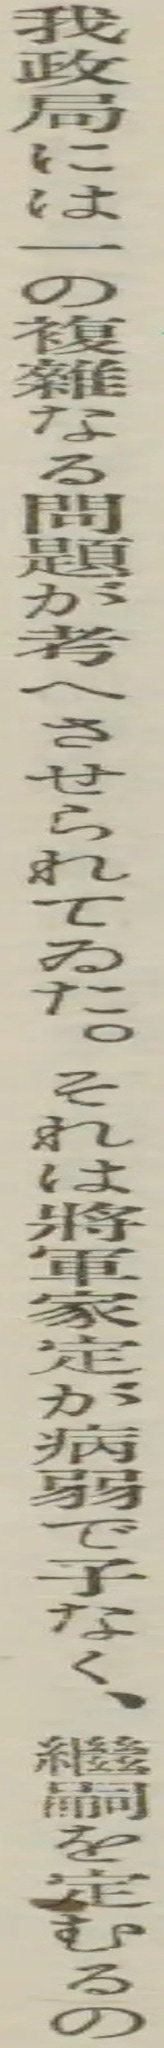我政局には一の複雑なる問題が考へさせられてゐた。それは将軍家定が病弱で子なく、継嗣を定むるの
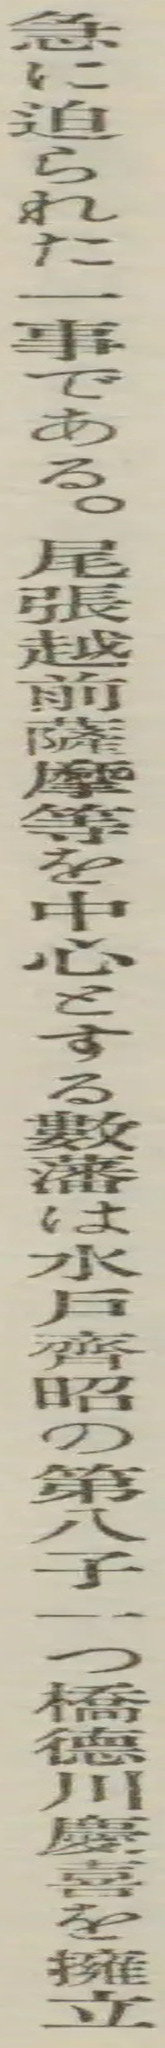急に迫られた一事である。尾張越前薩摩等を中心とする数藩は水戸齋昭の第八子一つ橋徳川慶喜を擁立
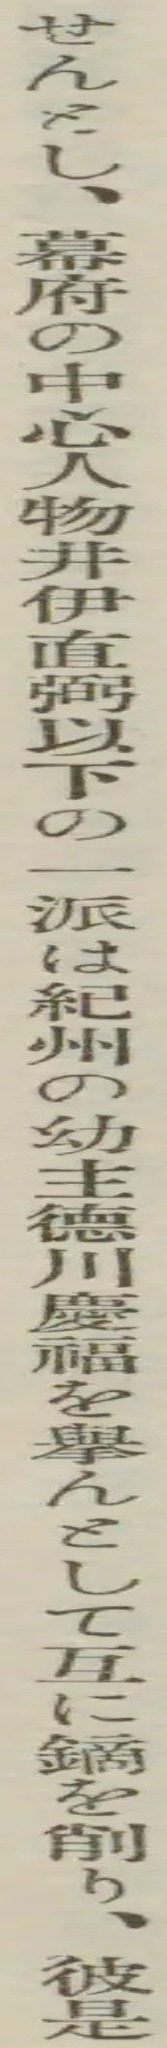せんとし、幕府の中心人物井伊直弼以下の一派は紀州の幼主徳川慶福を挙んとして互に鏑を削り、彼是
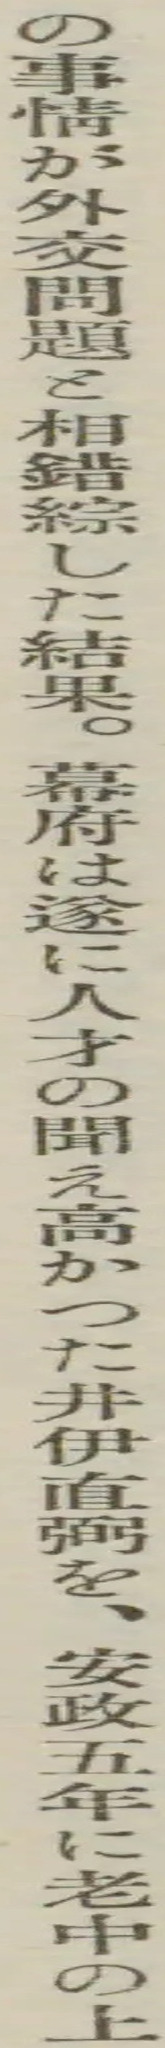の事情が外交問題と相錯綜した結果。幕府は遂に人才の聞え高かつた井伊直弼を、安政五年に老中の上
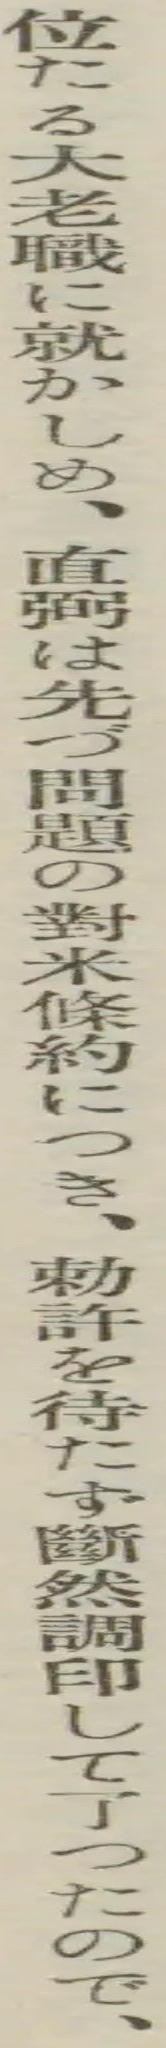位たる大老職に就かしめ、直弼は先づ問題の対米条約につき、勅許を待たず断然調印して了つたので、
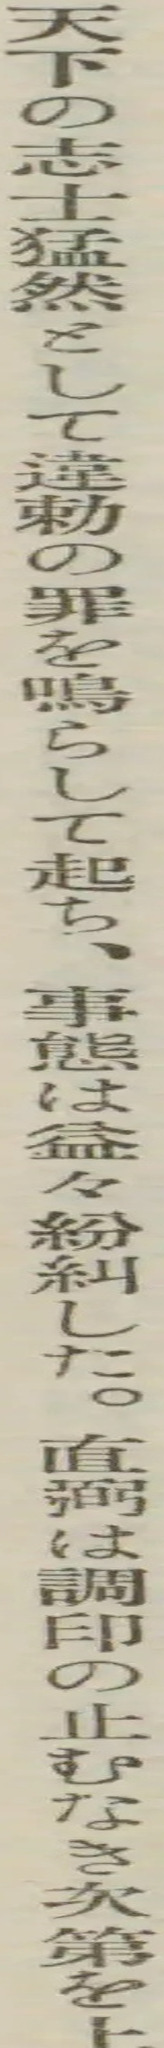天下の志士猛然として違勅の罪を鳴らして起ち、事態は益々粉糾した。直弼は調印の止むなき次第を上
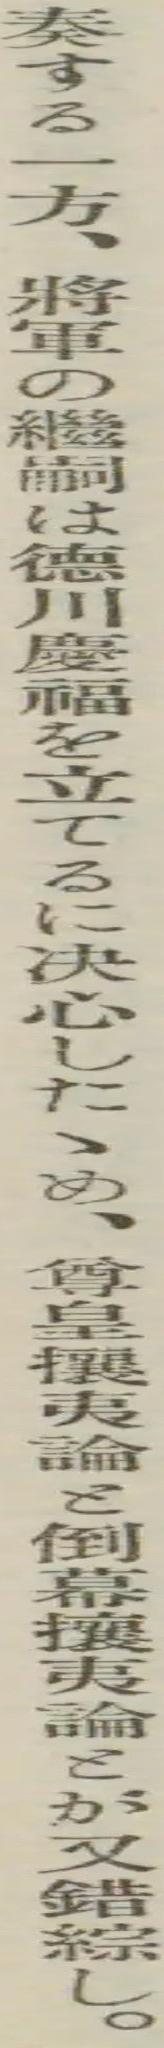奏する一方、将軍の継嗣は徳川慶福を立てるに決心したゝめ、尊王攘夷論と倒幕攘夷論とが又錯綜し。
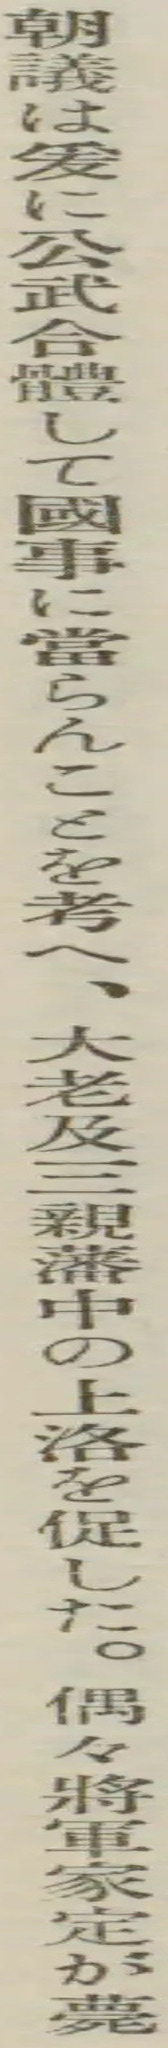朝議は爰に公武合体して国事に当らんことを考へ、大老及三親藩中の上洛を促した。偶々将軍家定が薨
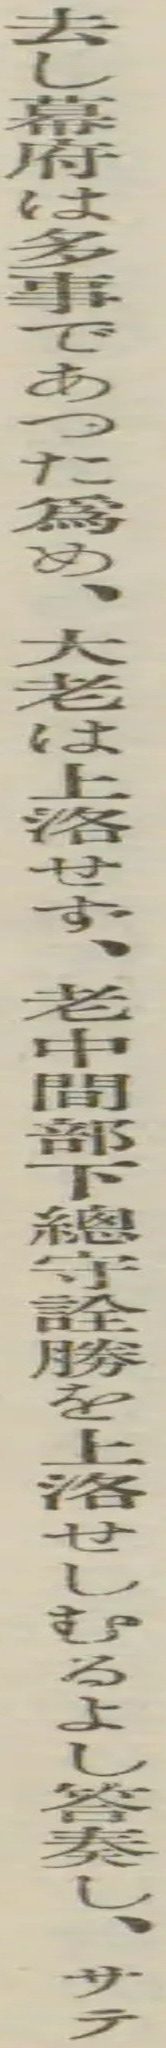去し幕府は多事であつた為め、大老は上洛せず、老中間部下総守詮勝を上洛せしむるよし答奏し、サテ
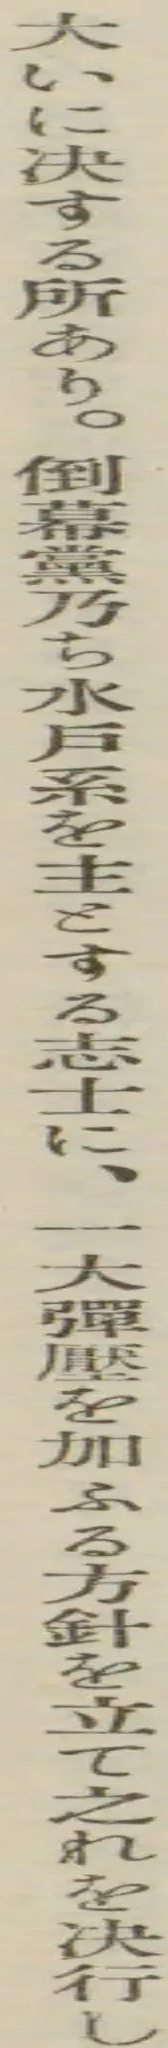大いに決する所あり。倒幕党乃ち水戸系を主とする志士に、一大弾圧を加ふる方針を立て之れを決行し

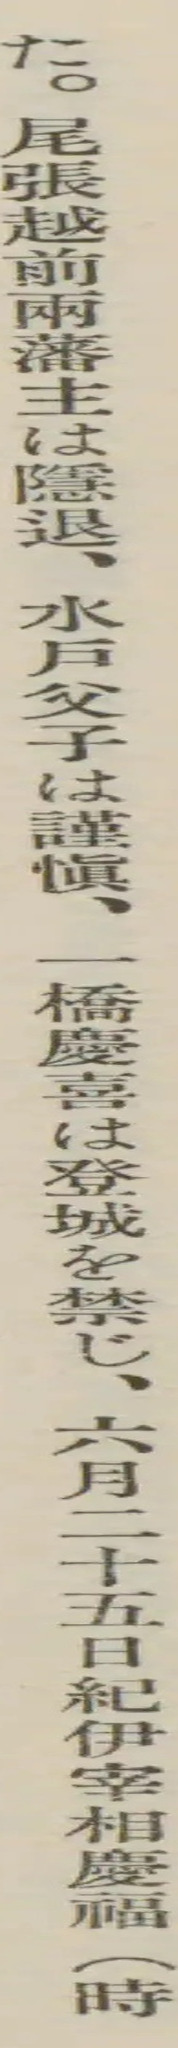た。尾張越前両藩主は隠退、水戸父子は謹慎、一橋慶喜は登城を禁じ、六月二十五日紀伊宰相慶福(時
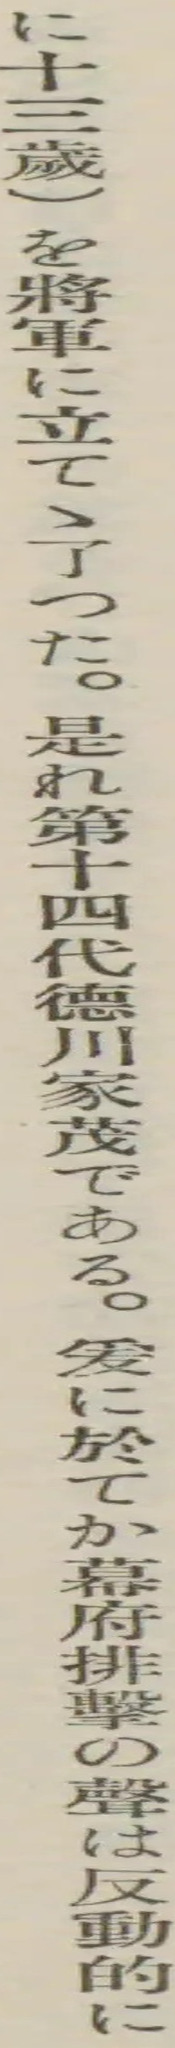に十三歳)を将軍に立てゝ了つた。是れ第十四代徳川家茂である。爰に於てか幕府排撃の声は反動的に
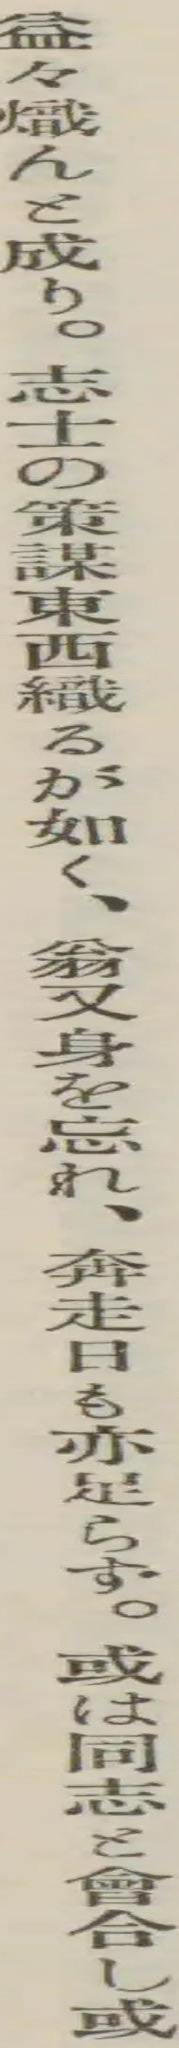益々熾んと成り。志士の策謀東西織るが如く、翁又身を忘れ、奔走日も亦足らず。或は同志と会合し或
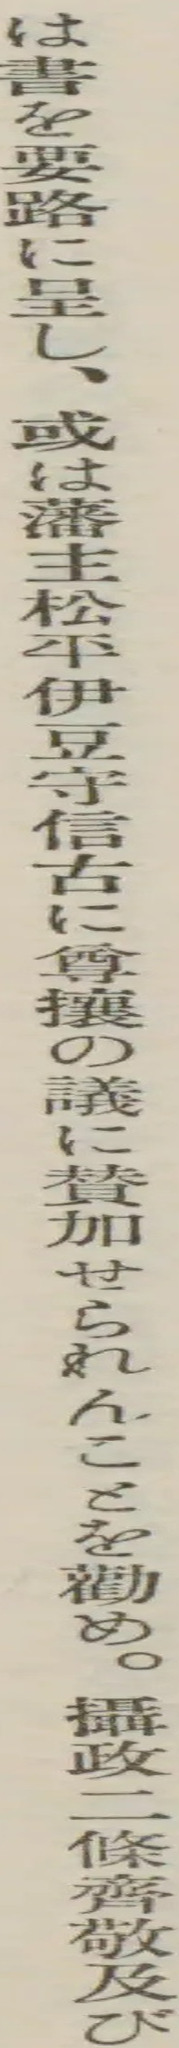は書を要路に呈し、或は藩主松平伊豆守信古に尊攘の議に賛加せられんことを勤め。摂政二条齊敬及び
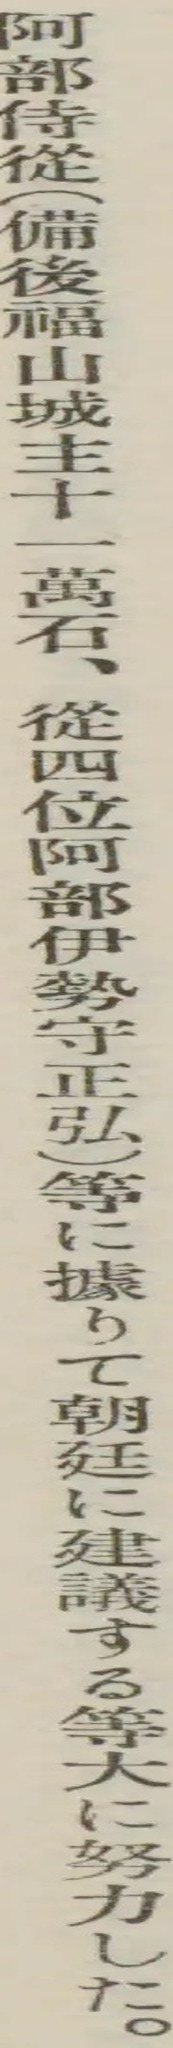阿部侍従(備後福山城主十一万石、従四位阿部伊勢守正弘)等に拠りて朝廷に建議する等大に努力した。
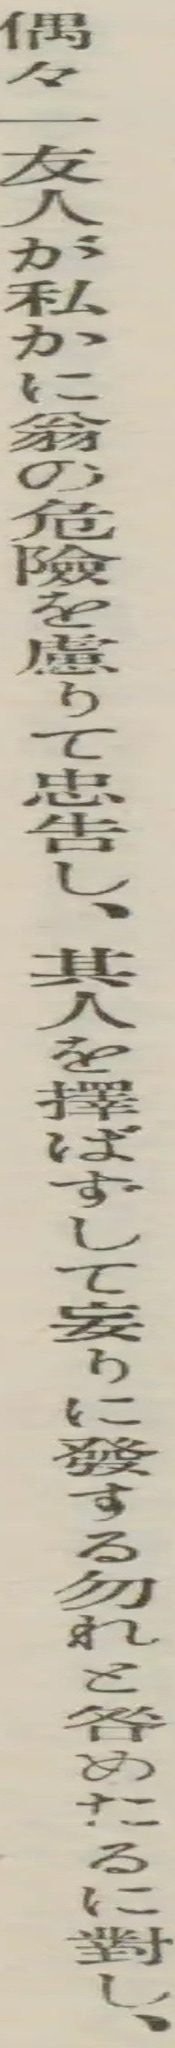偶々一友人が私かに翁の危険を慮りて忠告し、其人を択ばずして妄りに発する勿れと咎めたるに対し、
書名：小野湖山翁小伝
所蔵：国立国会図書館 National Diet Library, JAPAN
